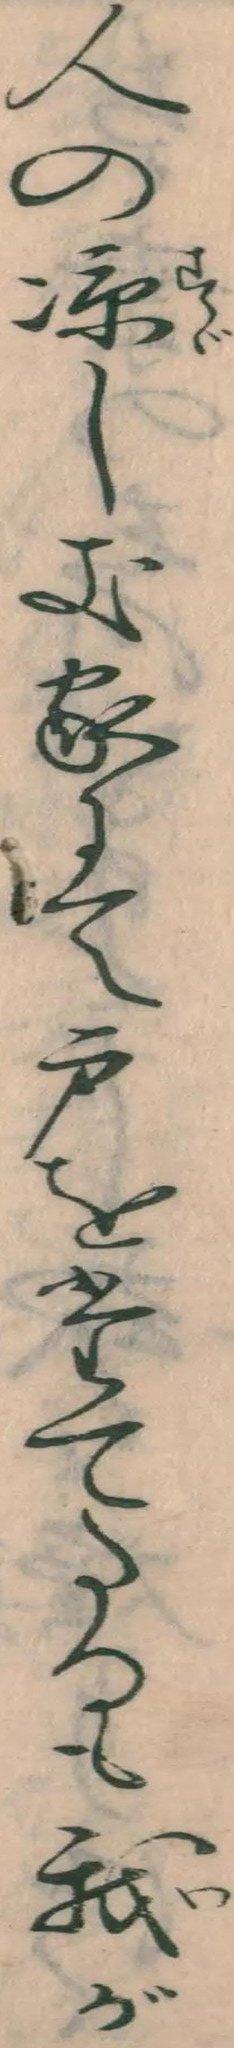人の涼しき家にて戸をたてたるもわ我が
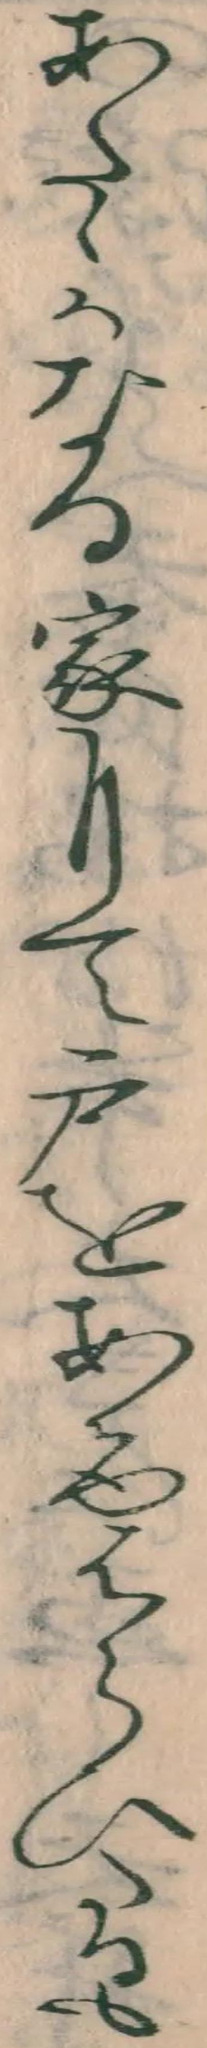あたゝかなる家にて戸をあけはらひたるも
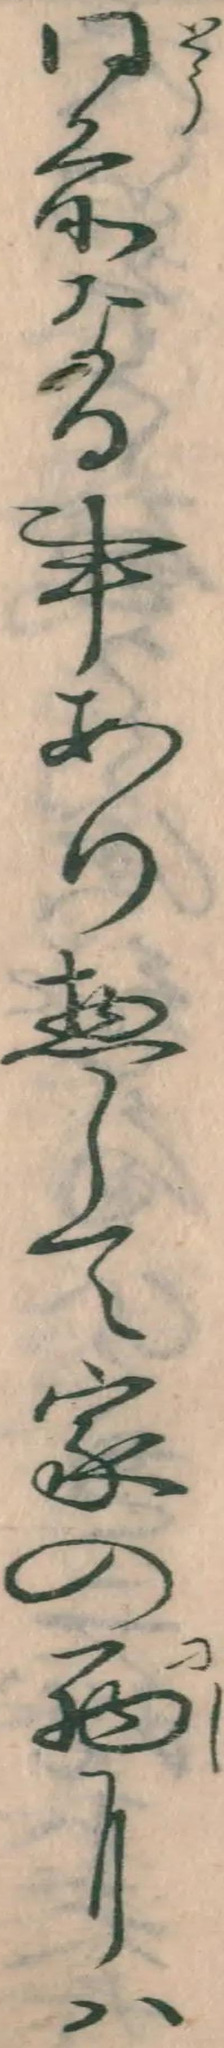同前なる事あり惣して家の西には
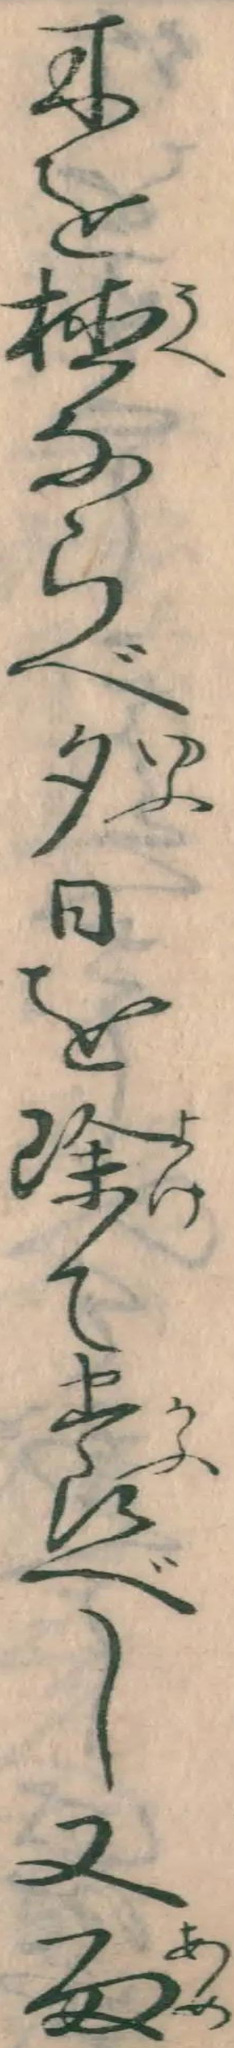木を植ならべ夕日を除て養べし又雨
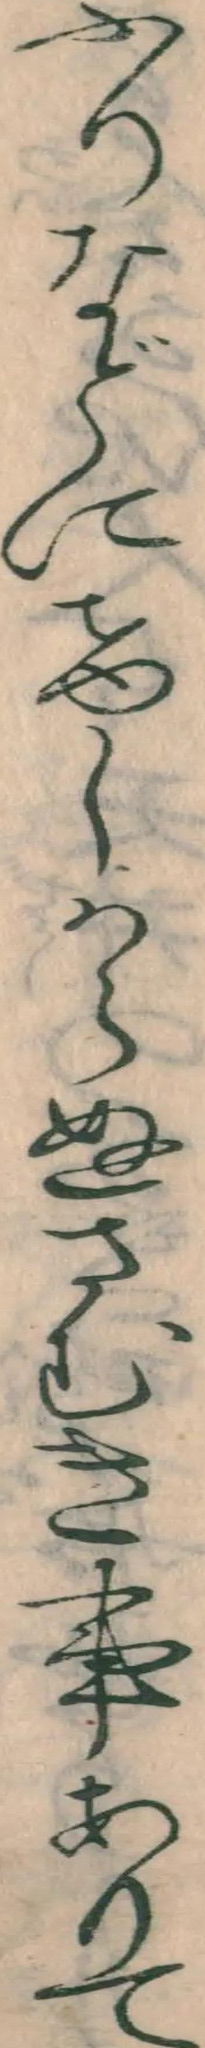ふりなどにけしからぬさむき事ありて
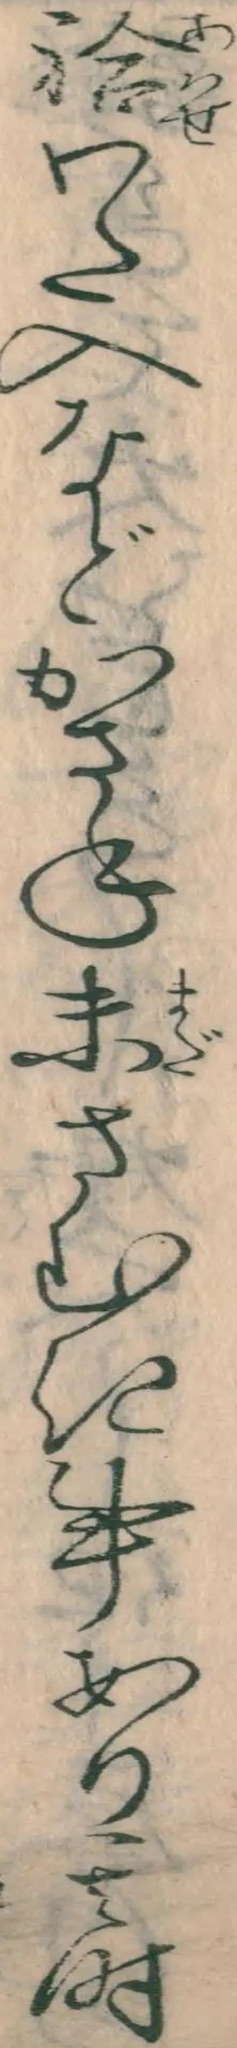袷わた入などかさね未さむき事あり其時
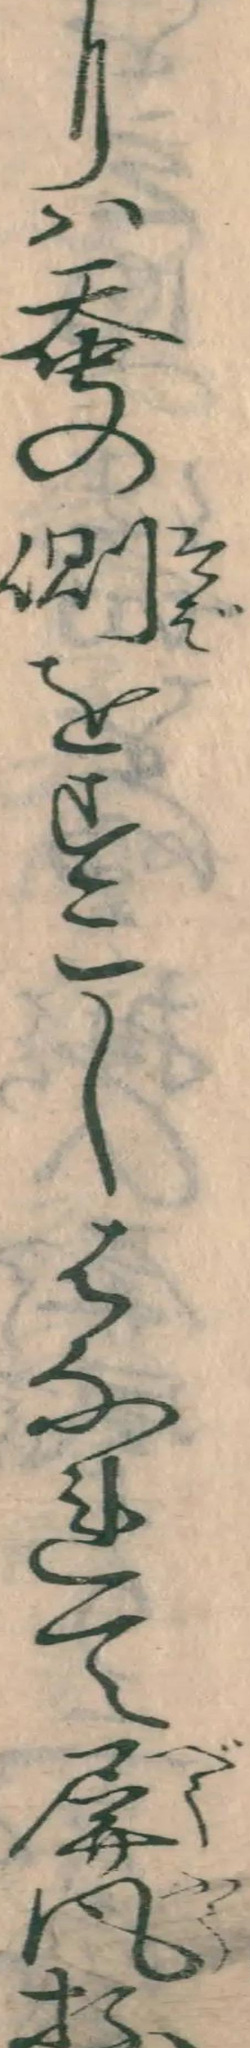には蚕の側をすこしはなれて屏風抔

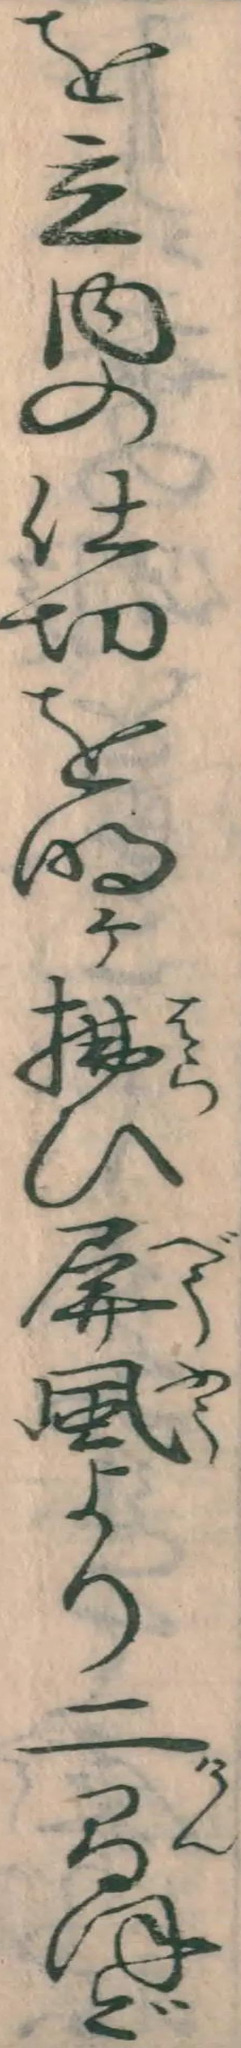を立内の仕切を明け払ひ屏風より二間ほど
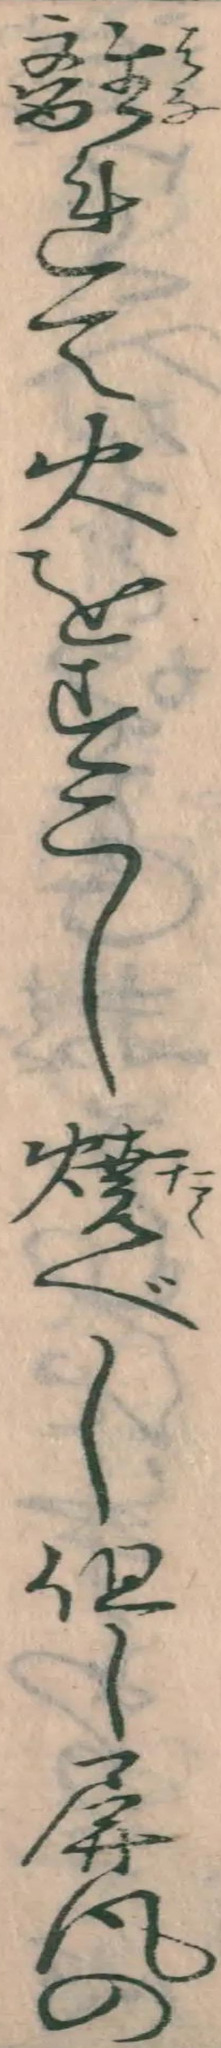離れて火をすこし焼べし但し屏風の
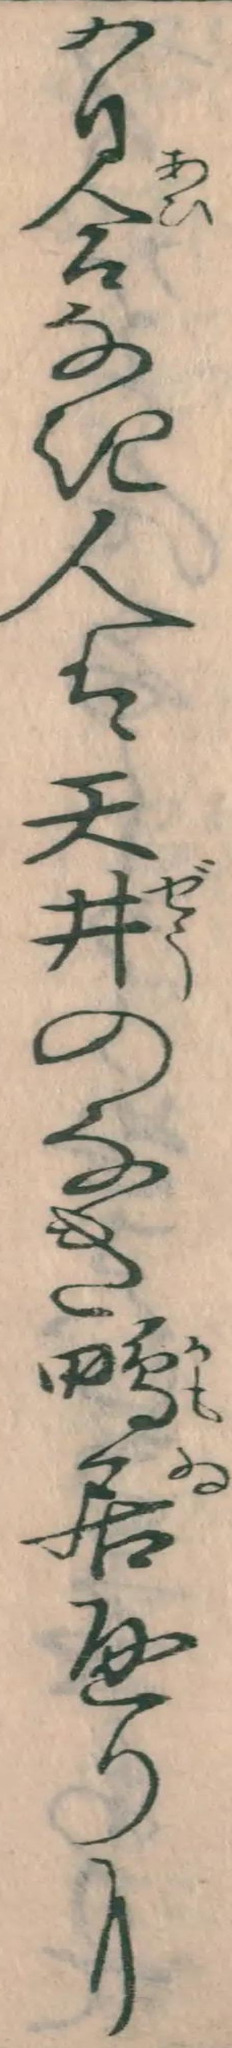有合なき人は天井のなき鴨居通りに
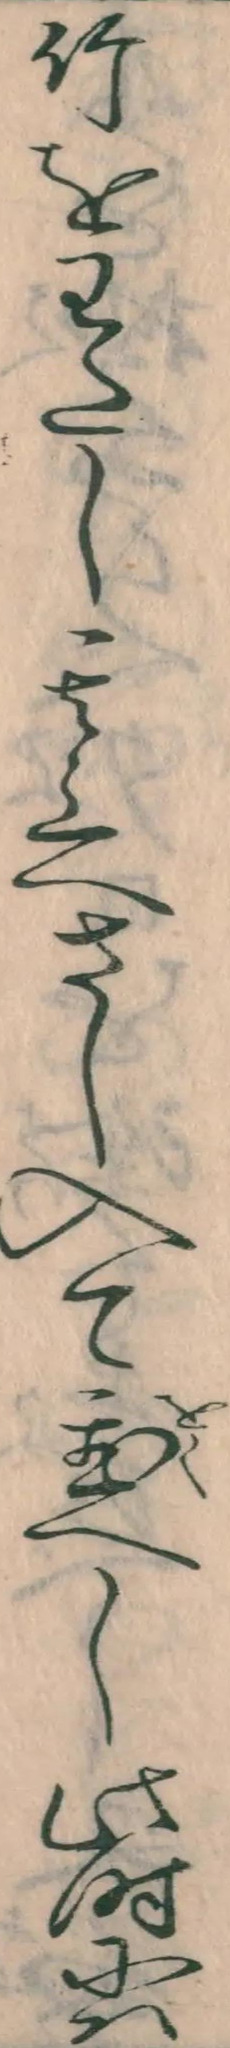竹をわたし其上へさし入て置へし此時には
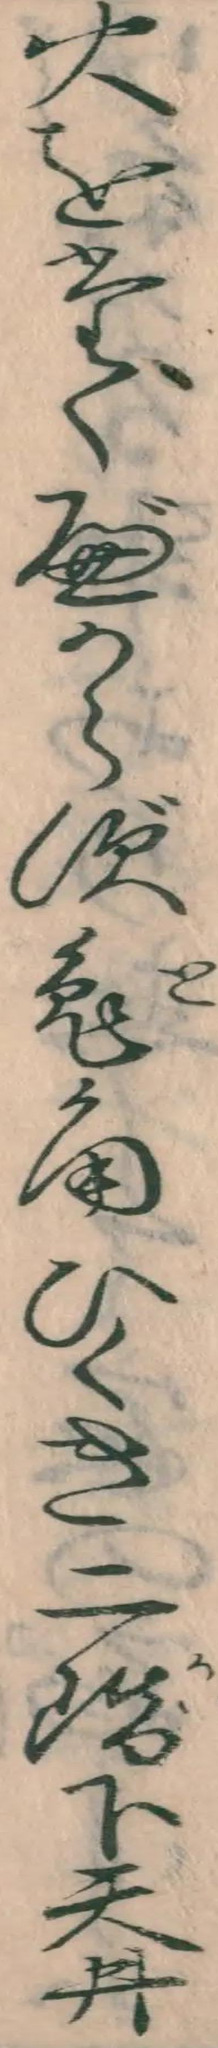火をたくべからず兎角ひくき二階下天井
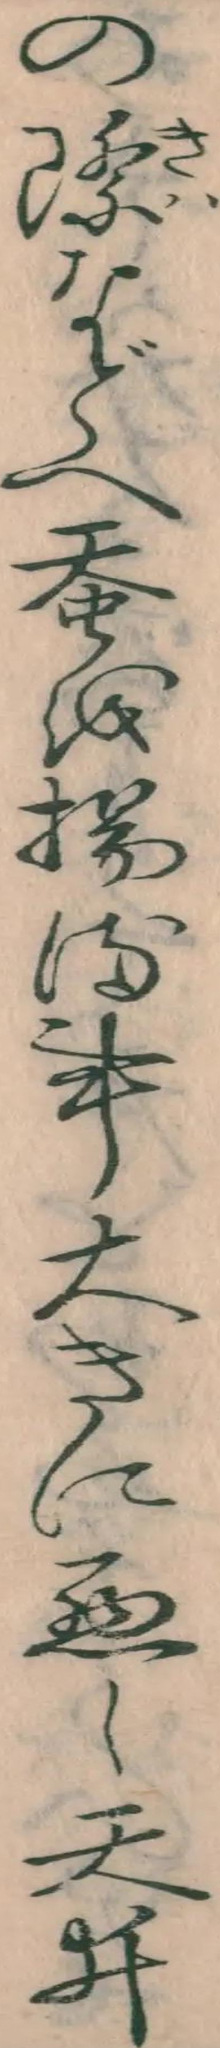の際などへ蚕を揚る事大きに悪し天井
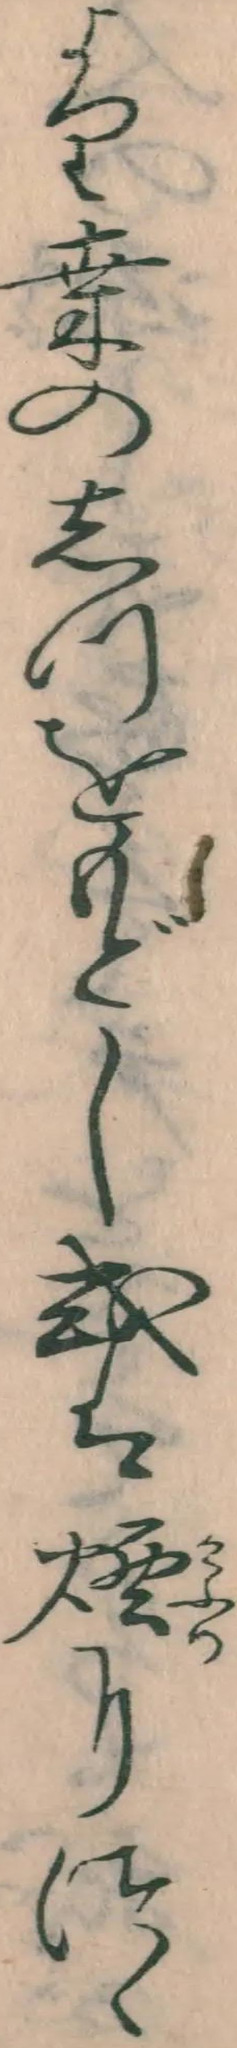より桑のしつをもどし或は煙につゝ
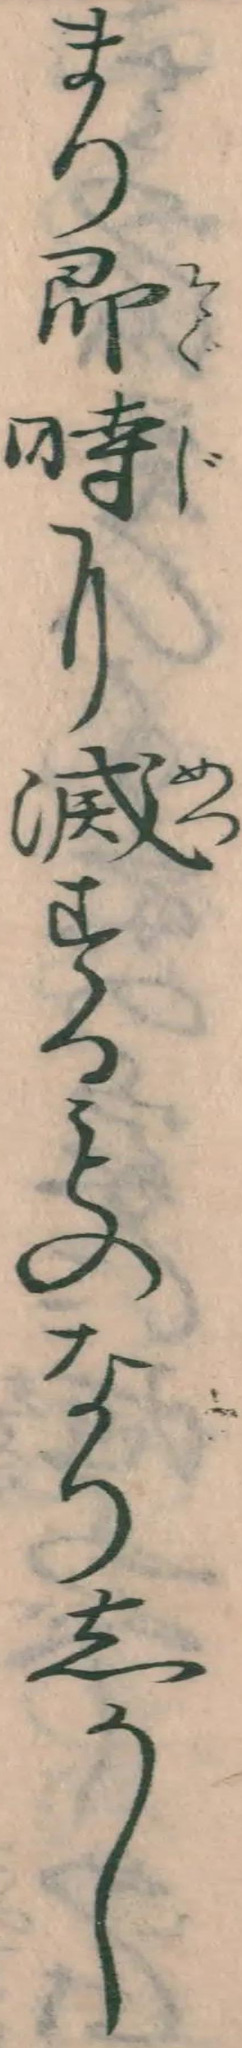まり即時に滅するものなりしかし
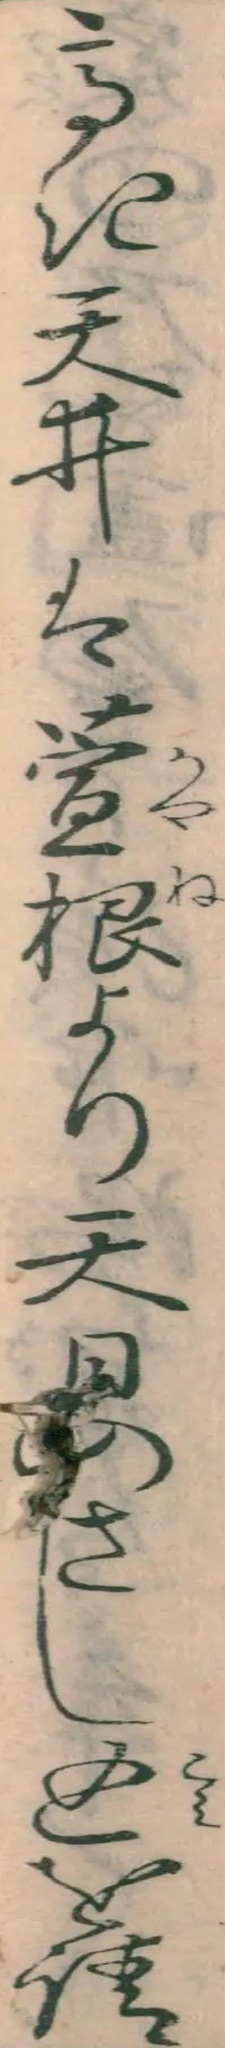高き天井は萱根より天日のさし込を請
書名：新撰養蚕秘書
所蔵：国立国会図書館 National Diet Library, JAPAN
